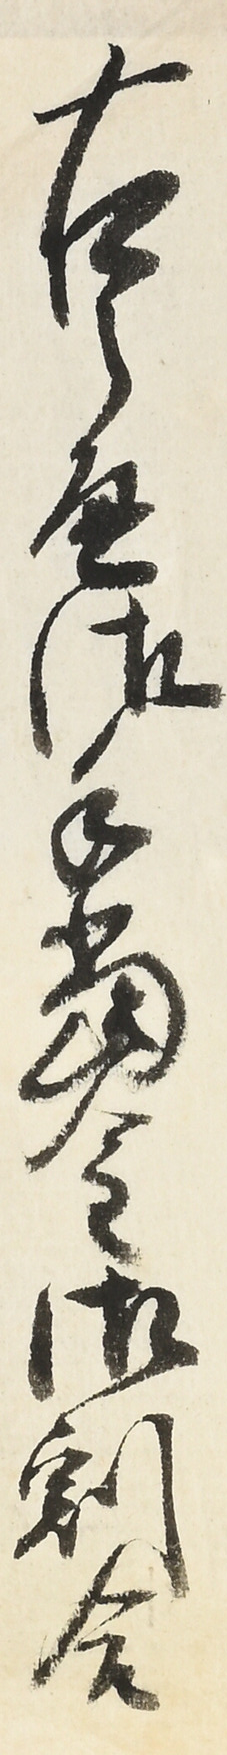右之通御手当金御割合

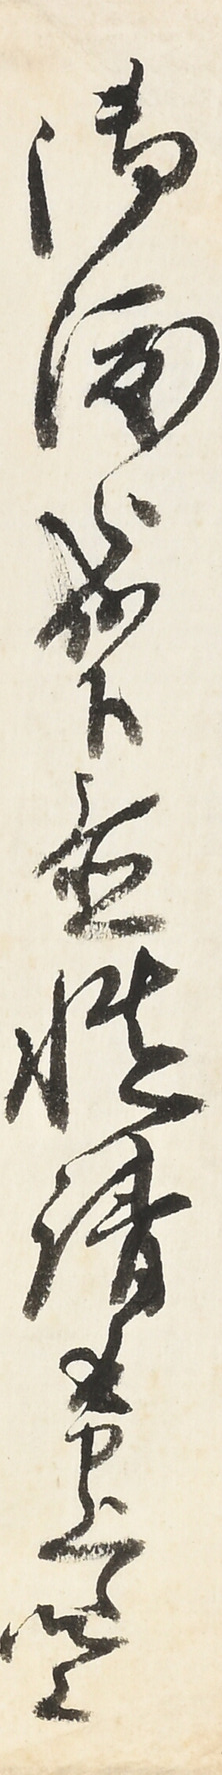御渡被成下置慥請取申上候以上
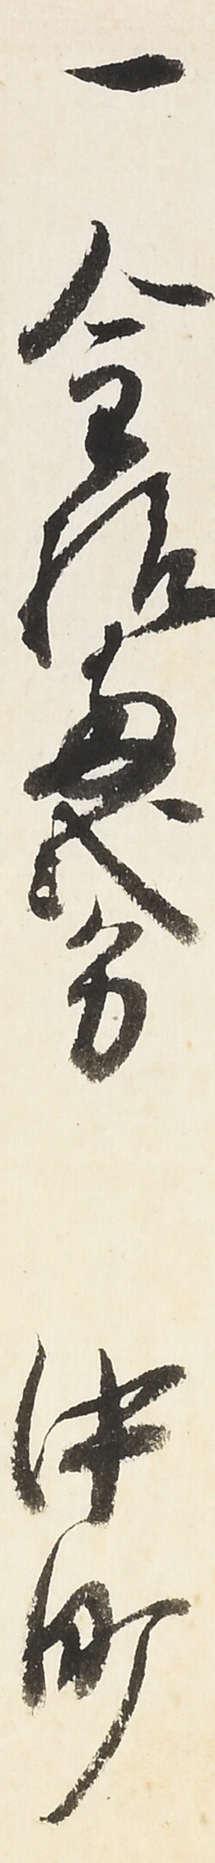一金拾両弐分中町
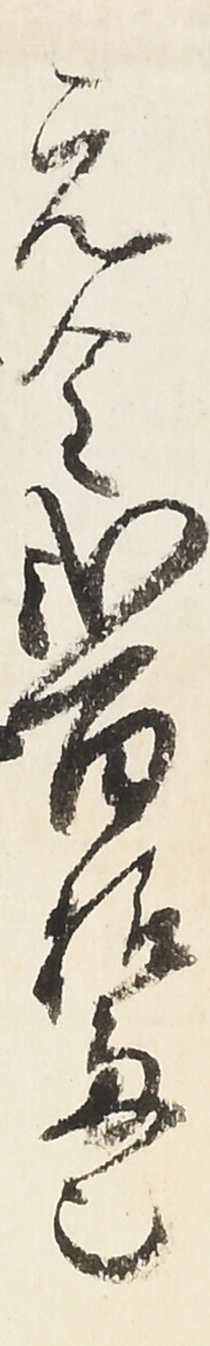元金弐百拾両也
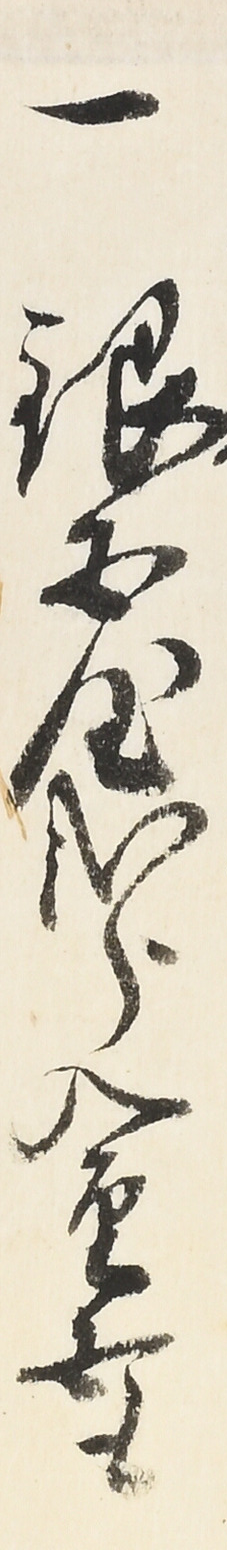一銀五匁弐分八厘五毛
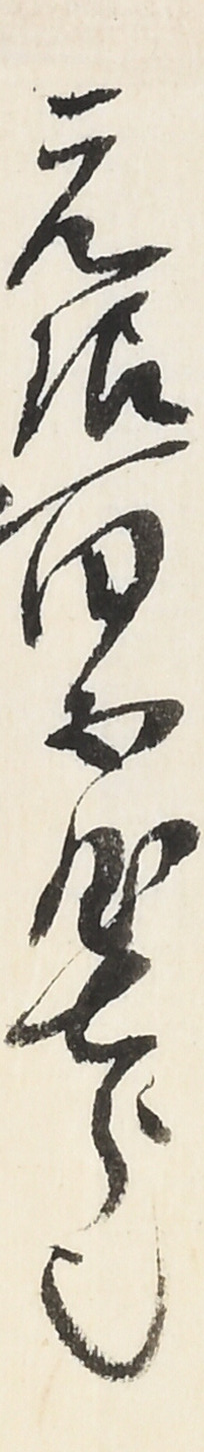元銀百五匁七分也
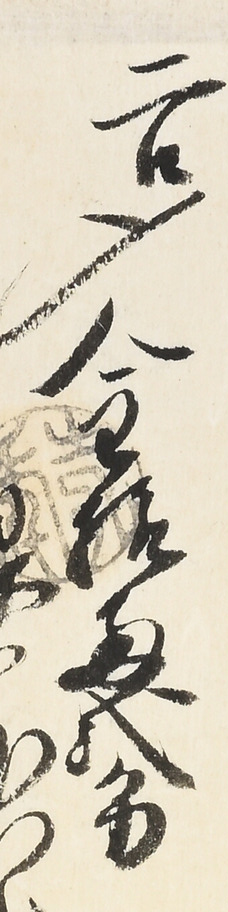二口〆金拾両弐分
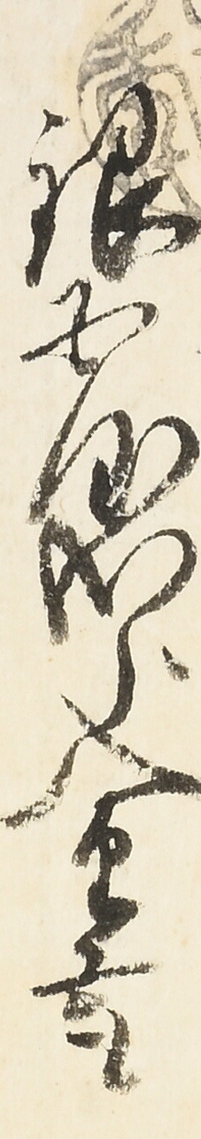銀五匁弐分八厘五毛
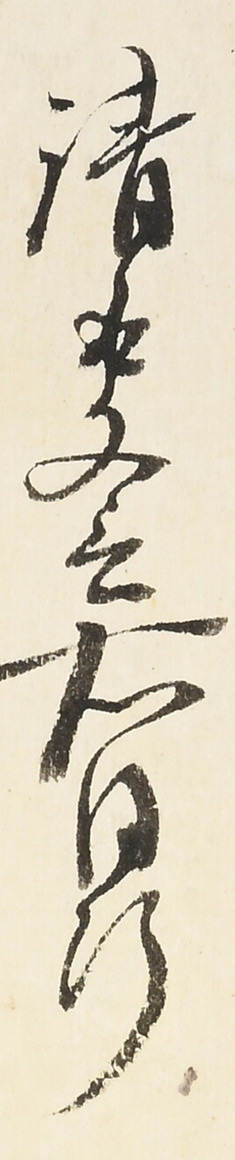請取文言右同断
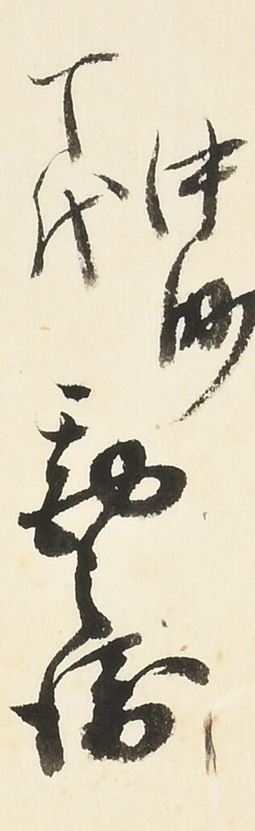丁代勘兵衛
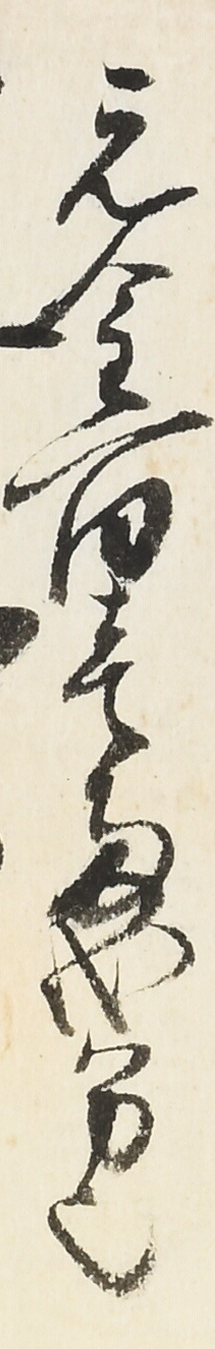元金百壱両弐分也
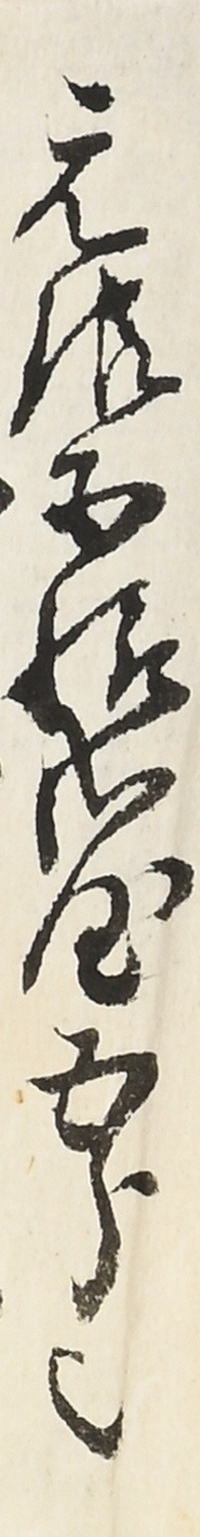元銀五拾弐匁五分也
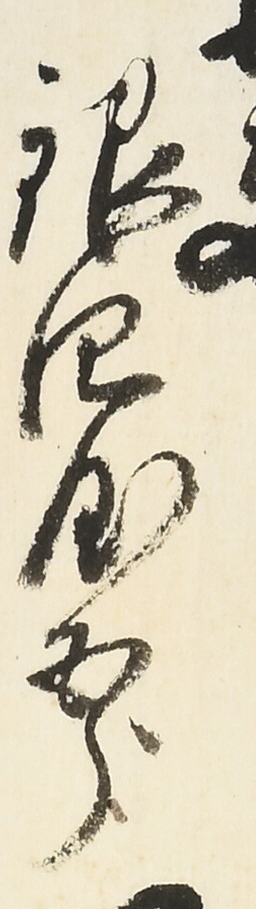銀四匁五分
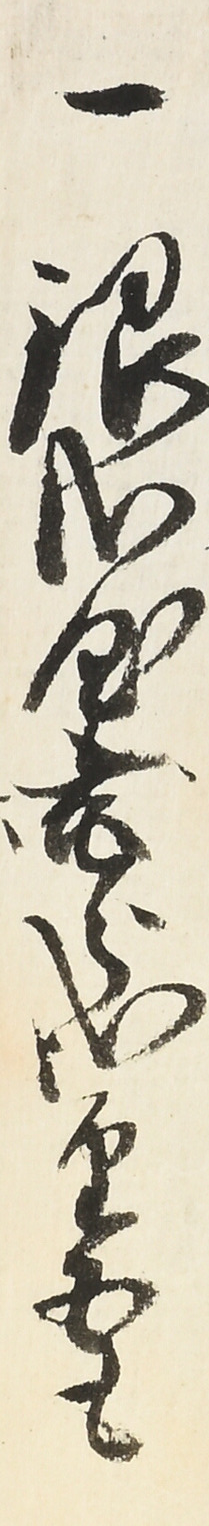一銀弐匁六分弐厘五毛
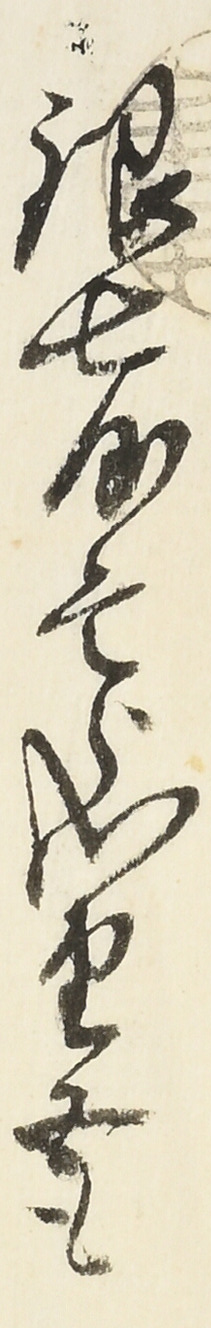銀七匁壱分弐厘五毛
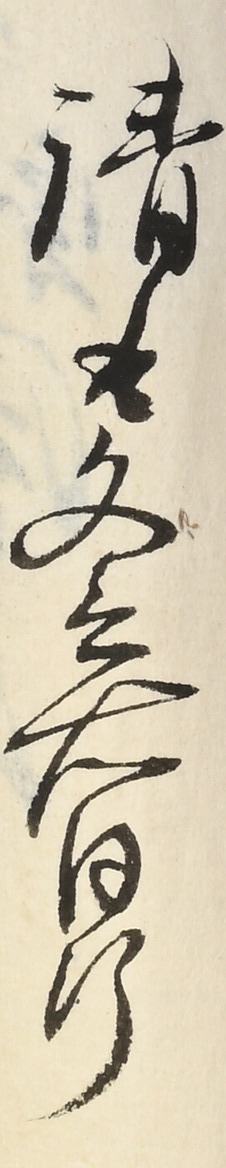請取文言右同断
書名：御才覚金御利足割渡扣帳
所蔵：伊那市立高遠町図書館・合同会社AMANE
